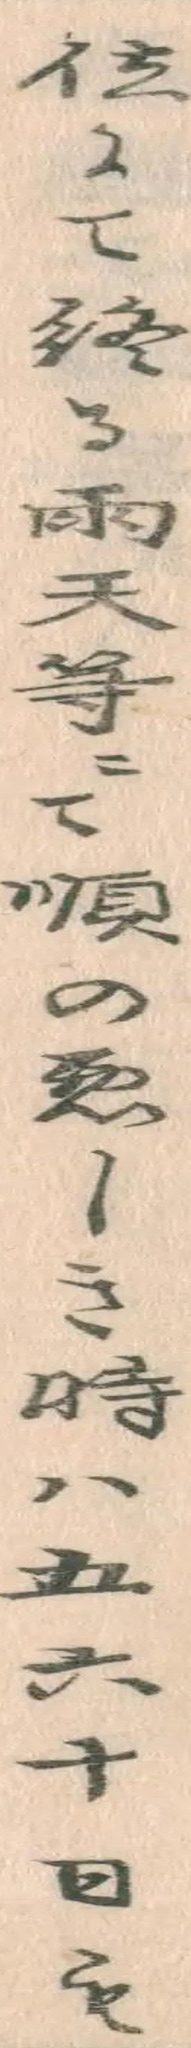位にて終る雨天等にて順の悪しき時は五六十日も
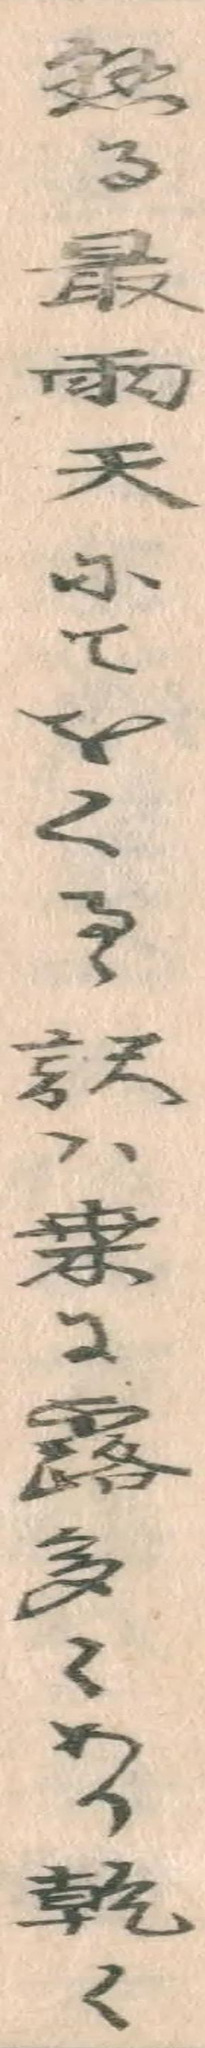懸る最雨天にてをくるゝ訳は桑に露多くあり乾く
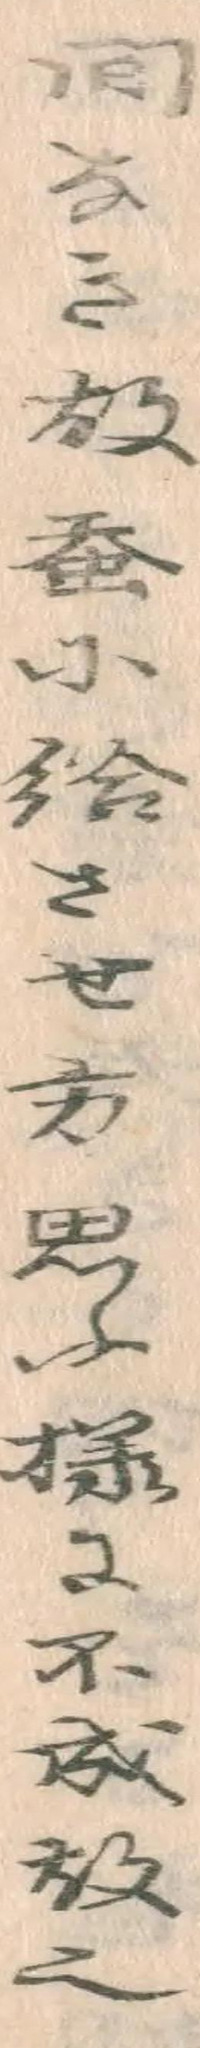間なき故蚕に給させ方思ふ様に不成故也
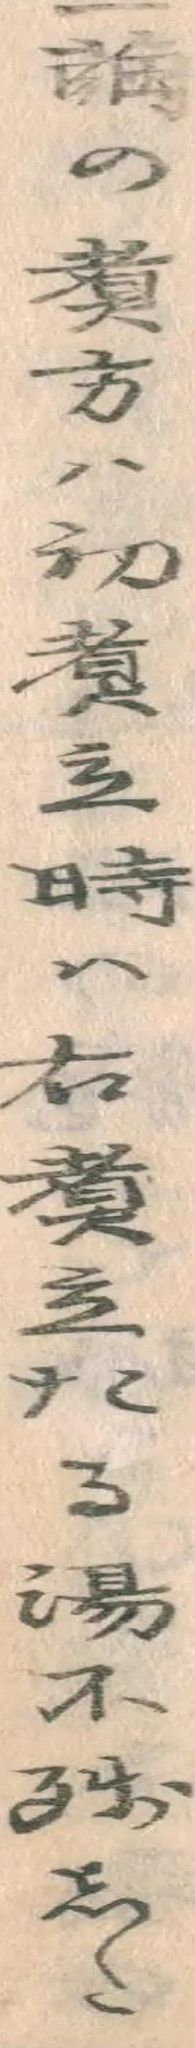一繭の煮方は初煮立時は右煮立たる湯不残した
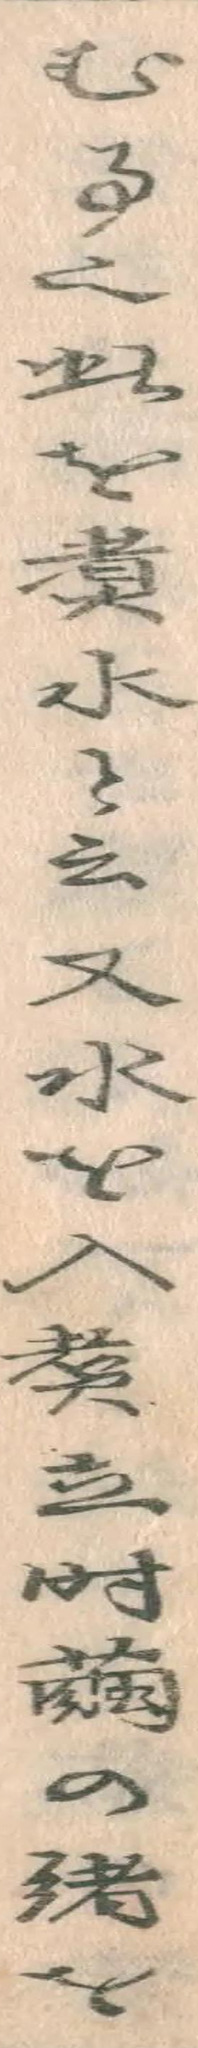む事也此を煮水と云又水を入煮立時繭の緒を
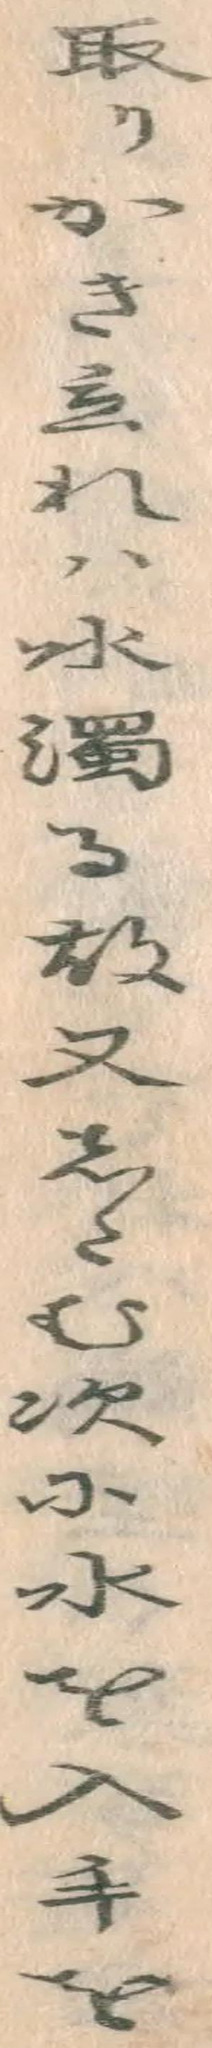取りかき立れは水濁る故又したむ次に水を入手を
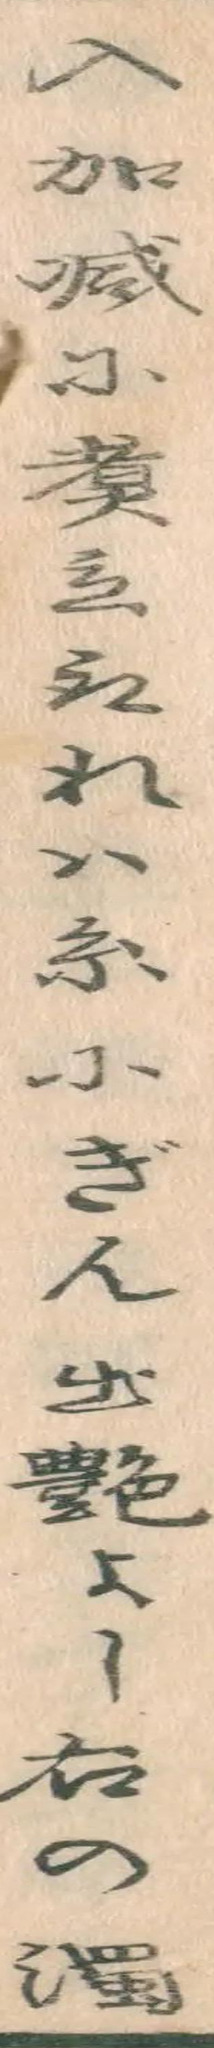入加減に煮立取れは糸にぎん出艶よし右の濁
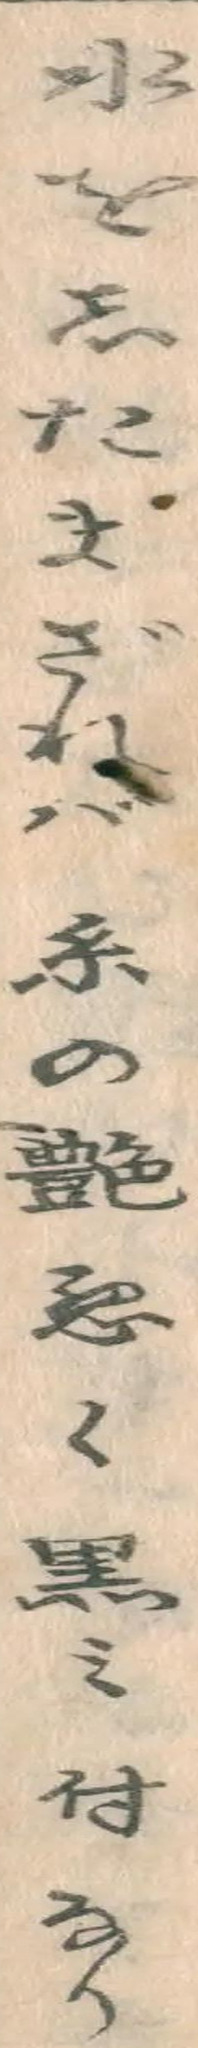水をしたまざれば糸の艶悪く黒み付なり

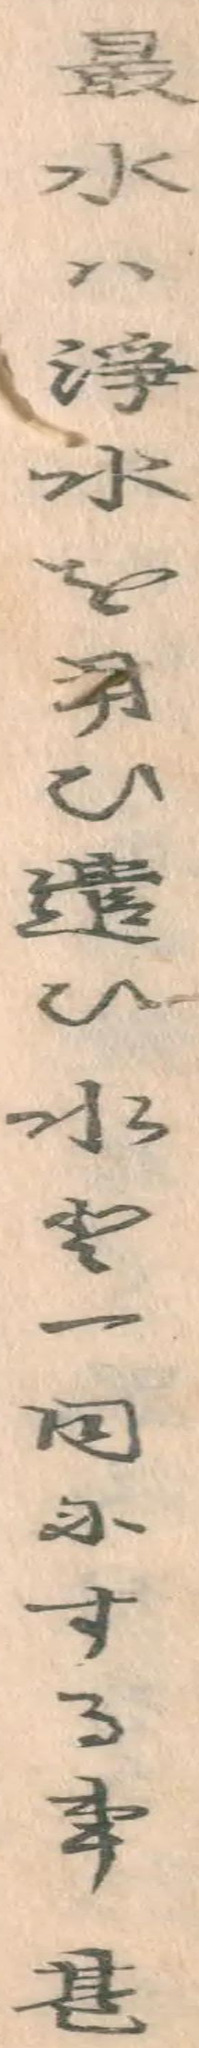最水は浄水を用ひ遣ひ水と一同にする事甚
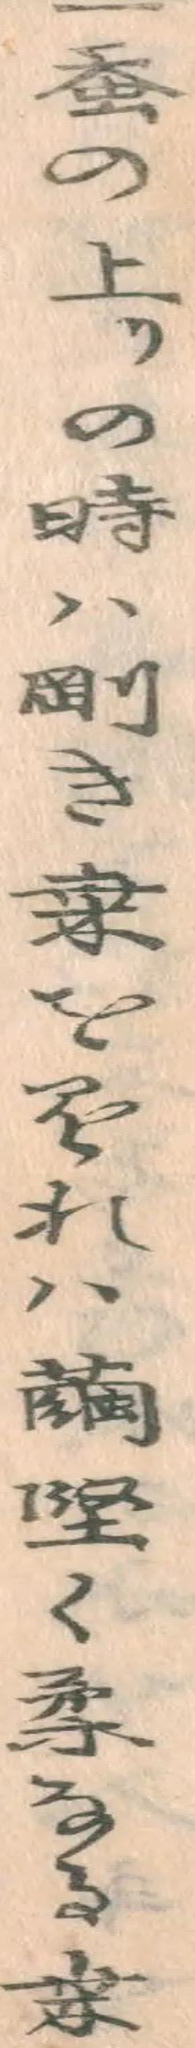一蚕の上りの時は剛き桑を懸れは繭堅く柔なる桑
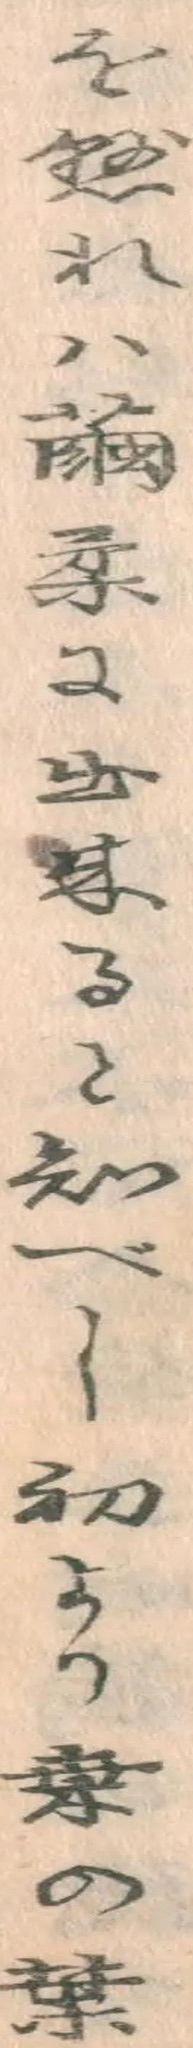を懸れは繭柔に出来ると知べし初より桑の葉
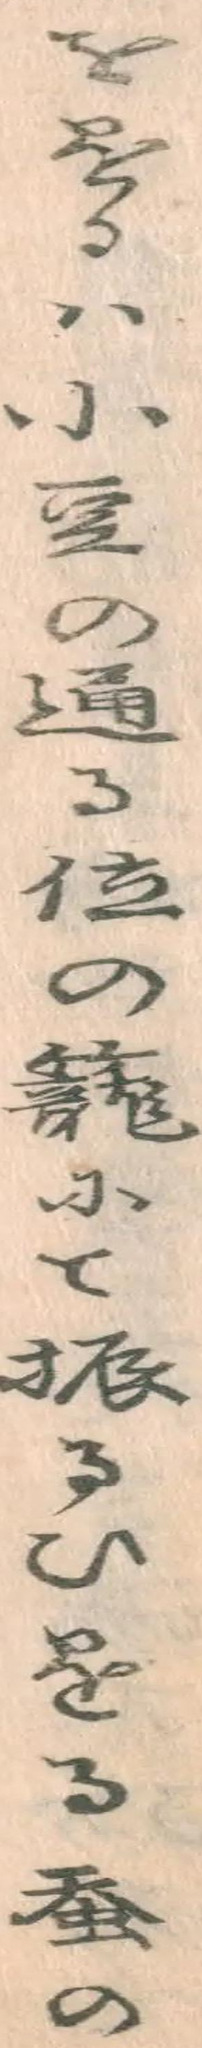を懸るは小豆の通る位の籠にて振るひ懸る蚕の
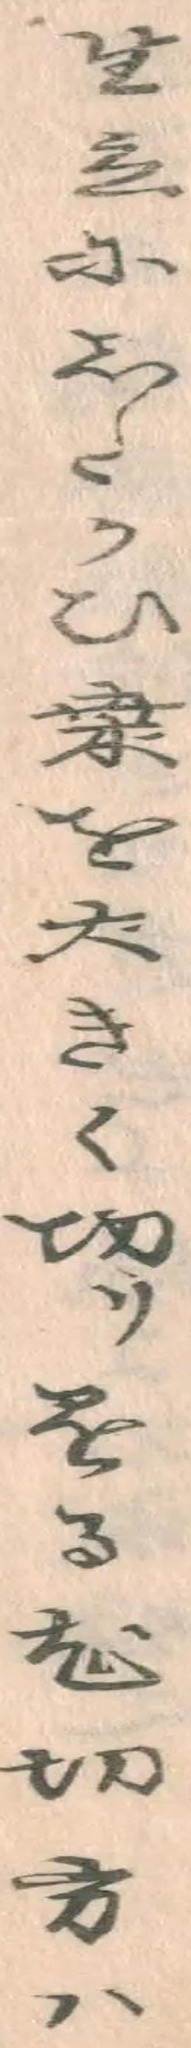生立にしたかひ桑を大きく切り懸る尤切方は
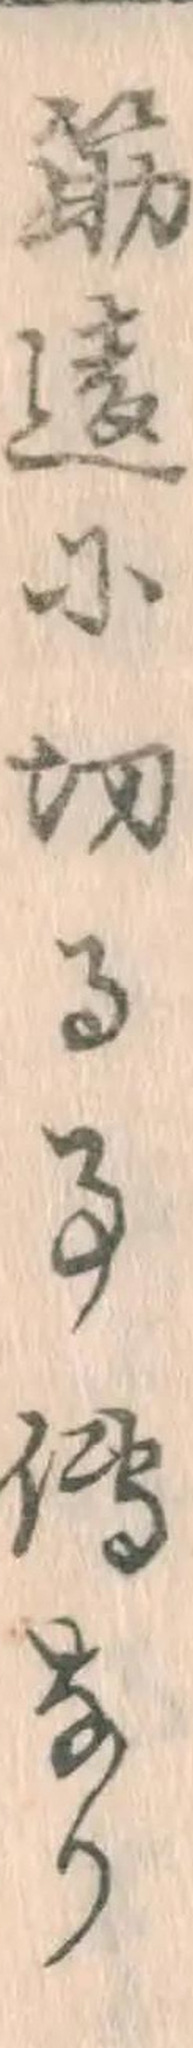筋違に切る事伝なり
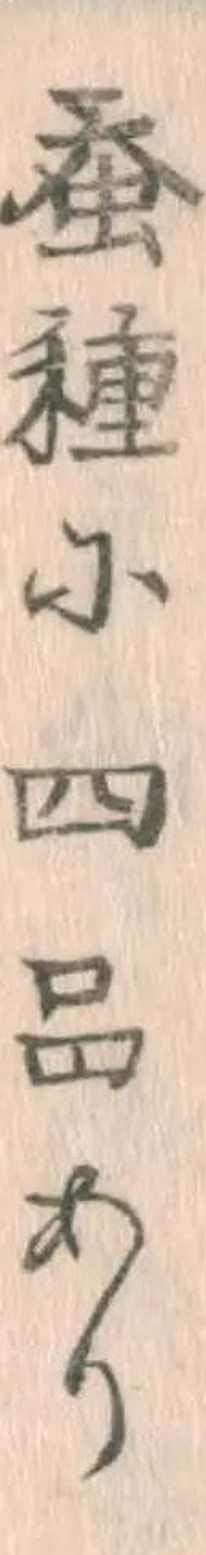蚕種に四品あり
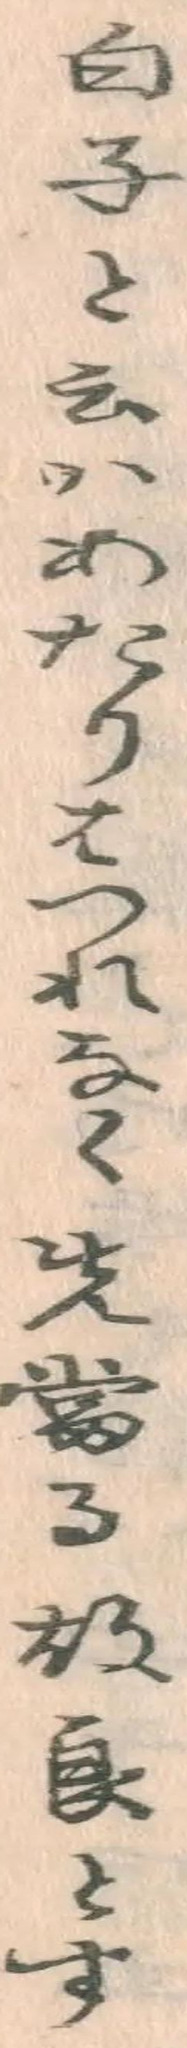白子と云はあたりはつれなく先当る故良とす
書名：機織彙編 5巻. [1]
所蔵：国立国会図書館 National Diet Library, JAPAN
